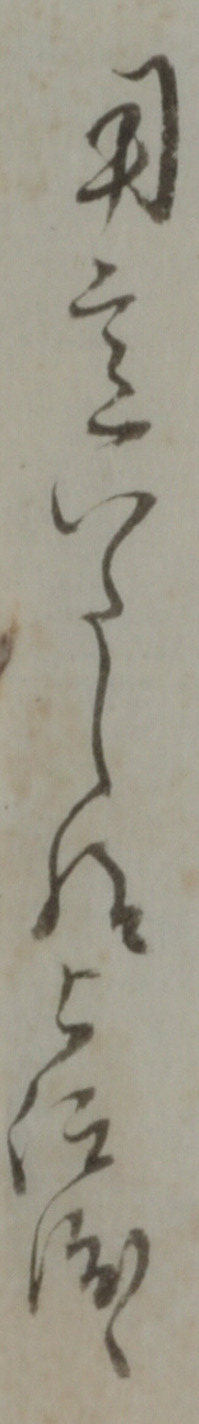用意いたし様被仰渡候
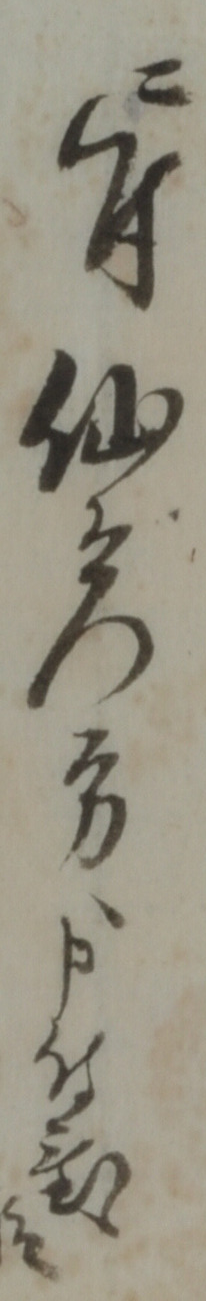ニ付仙右衛門方へ申付置候段
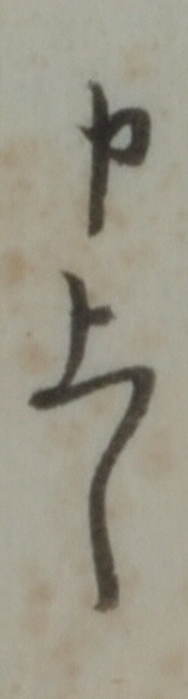申上候
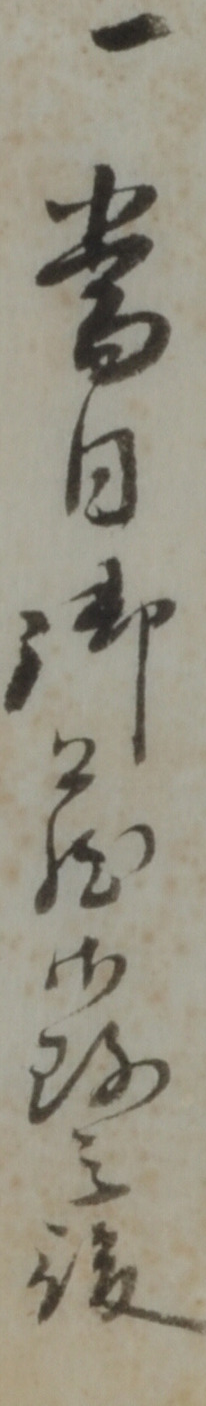一当日御蔵御改之後
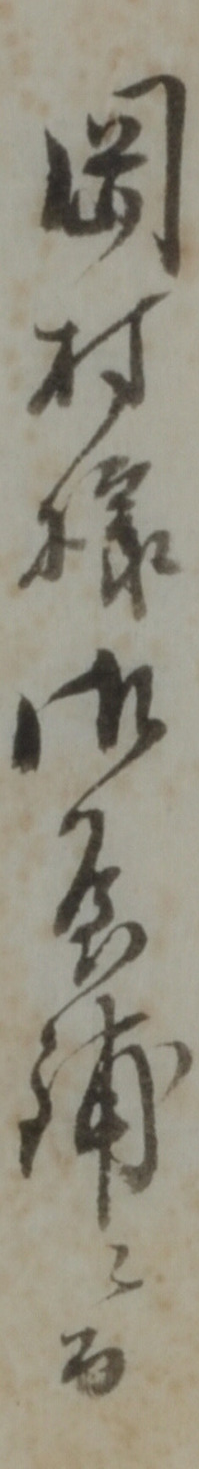岡村様御屋鋪ニ而
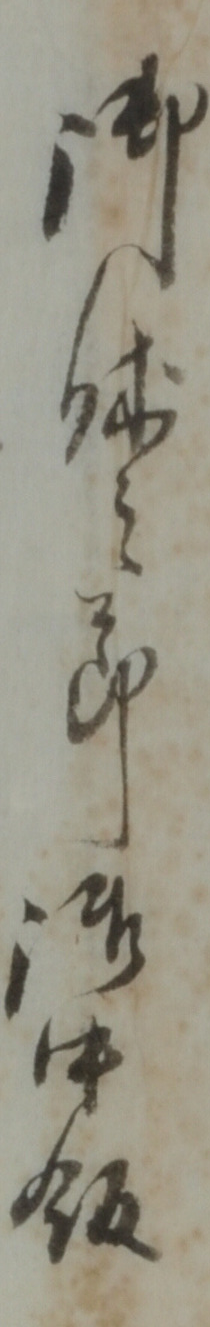御休之節御中飯
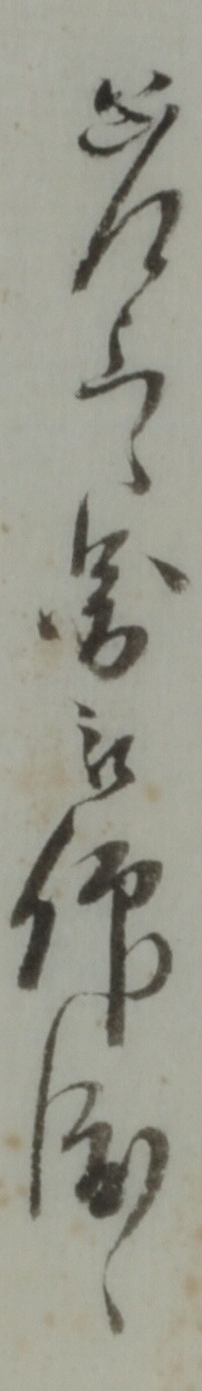差上候図被仰渡候
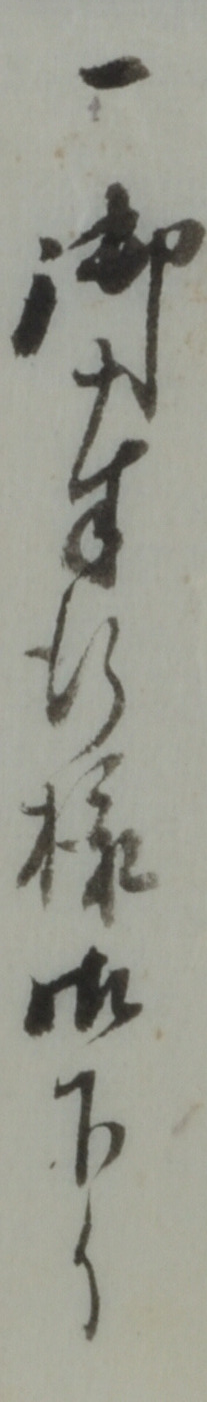一御奉行様御下り
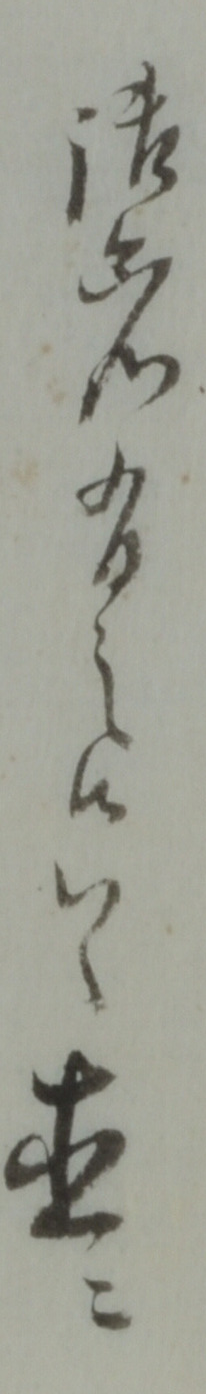御着有之候ハヽ直ニ
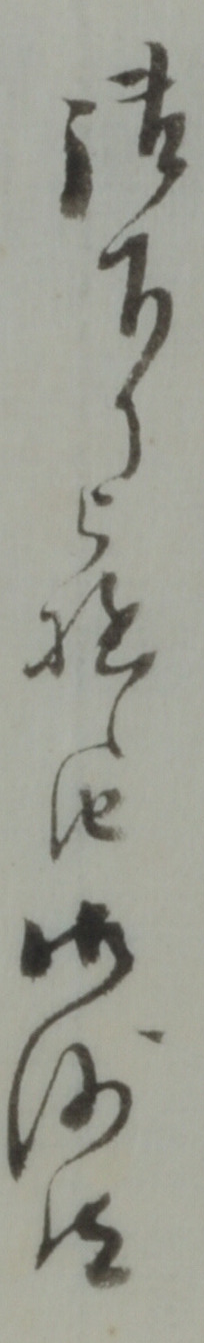御下り被遊候由御沙汰
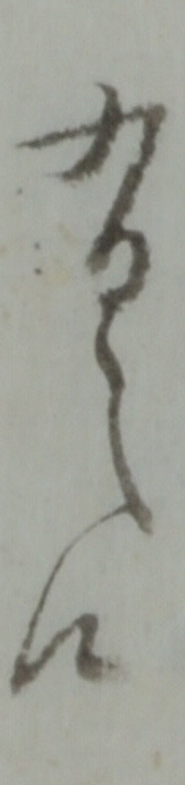有之候
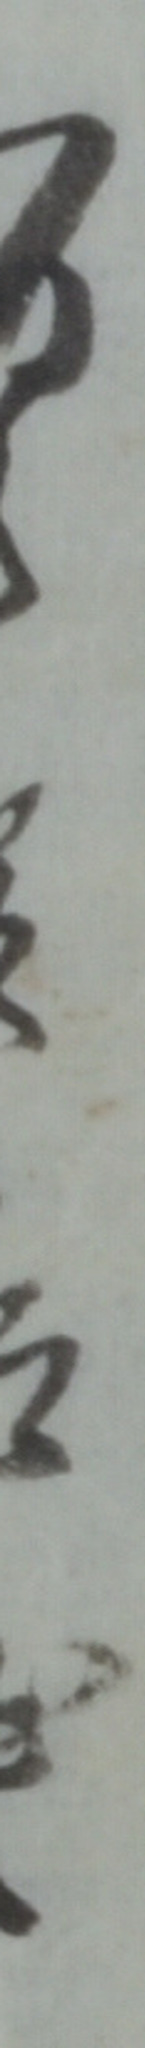差上候図被仰渡候

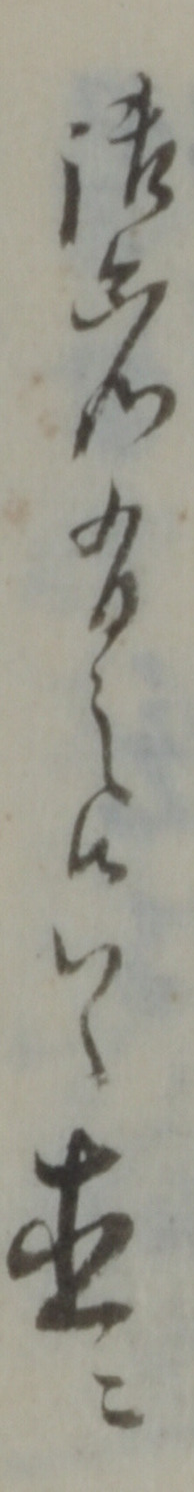御着有之候ハバ直ニ
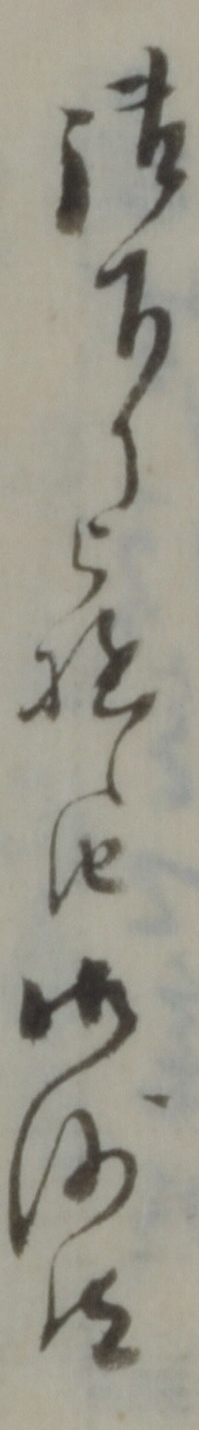御下り被遊候由御沙汰
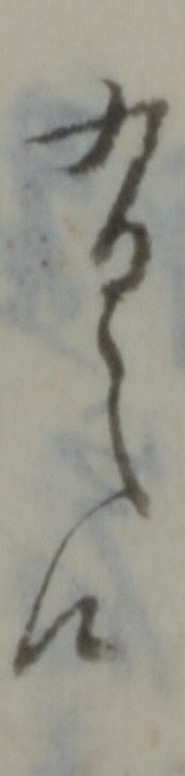有之候
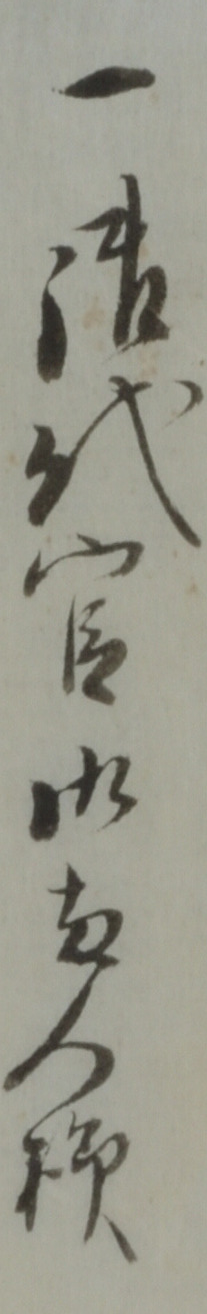一御代官御両人様
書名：御勘定御普請役江戸御役人様諸事控
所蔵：伊那市立高遠町図書館・合同会社AMANE
